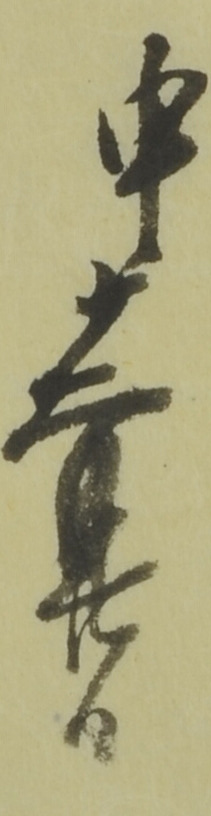申十二月廿日
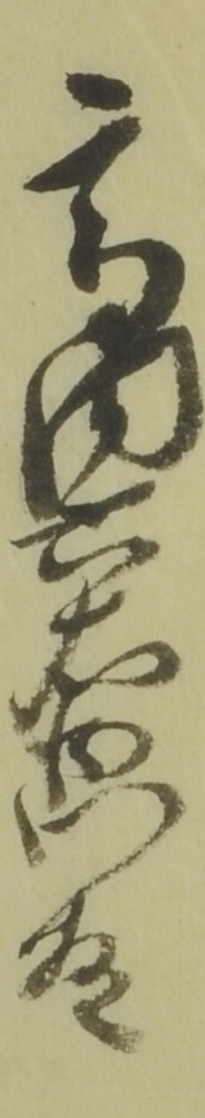高田六右衛門殿
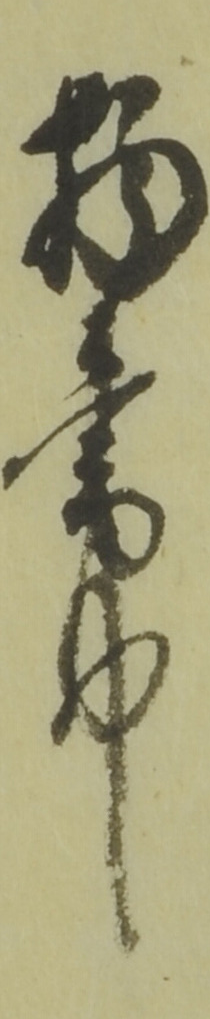物書中
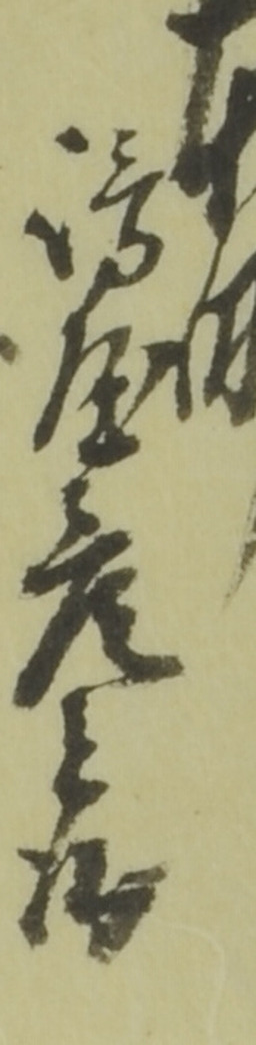嶋屋彦兵衛
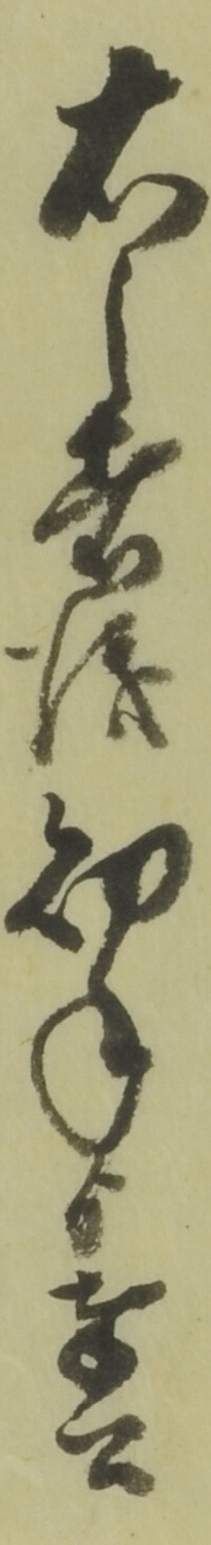右之者儀幼年ゟ奉公
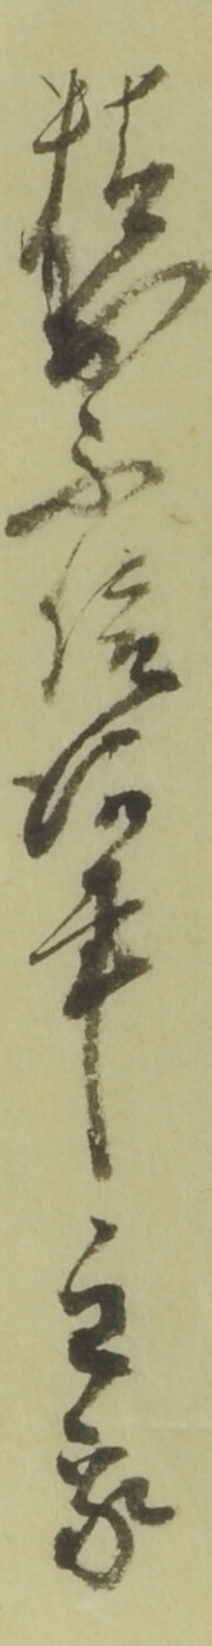精出不依何事主家

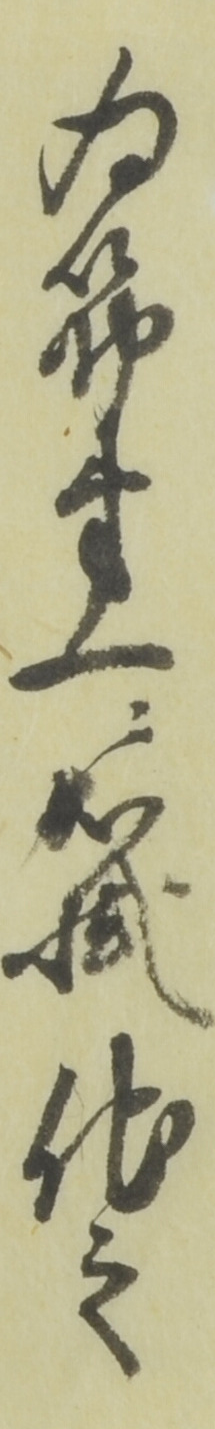為筋第一ニ心掛他之
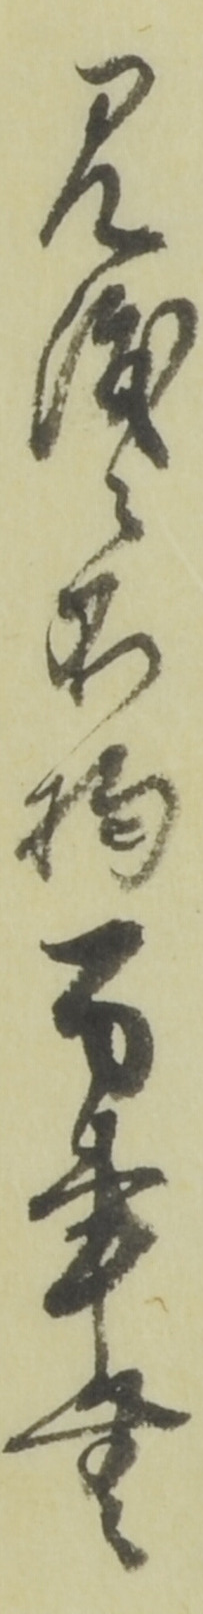見渡ニ不拘万事無
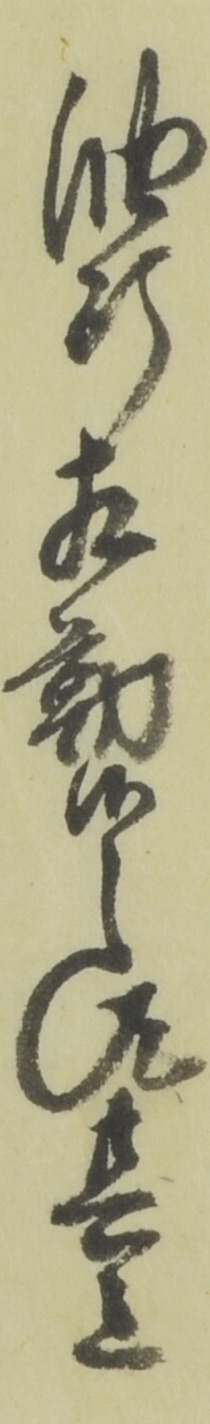油断相勤候之趣其上
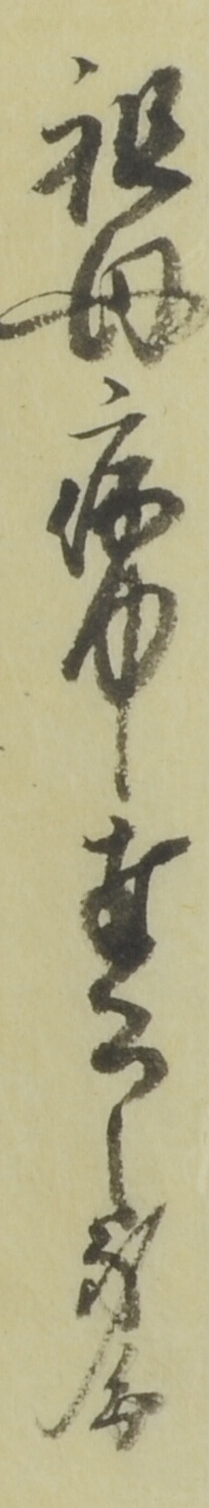祖母病中奉公之身分
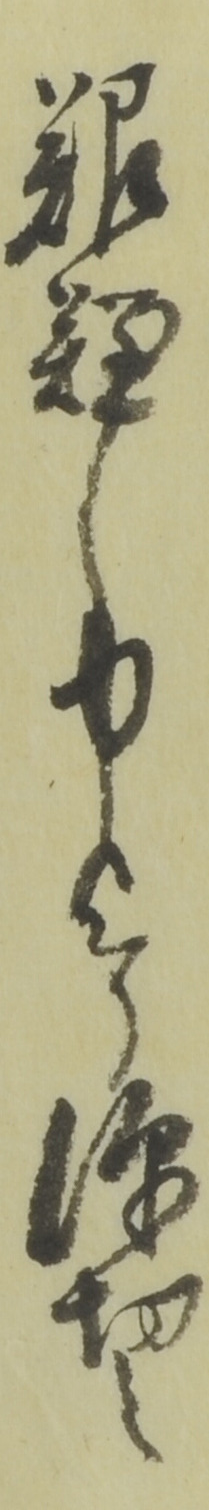艱難之中より深切之
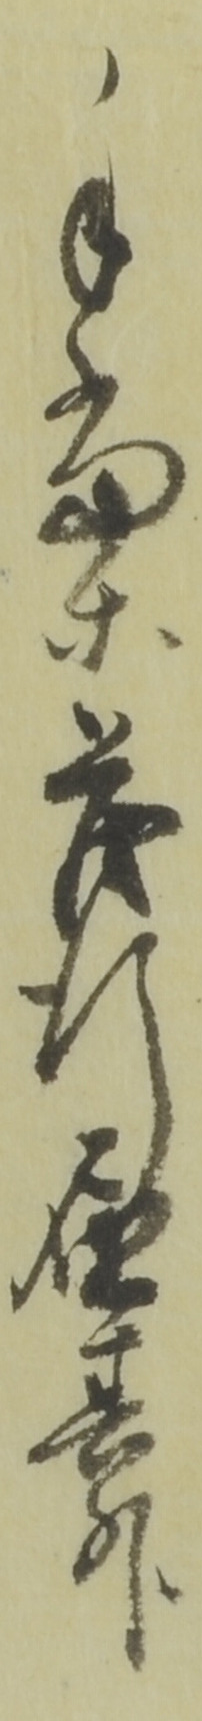手当等も行届其外
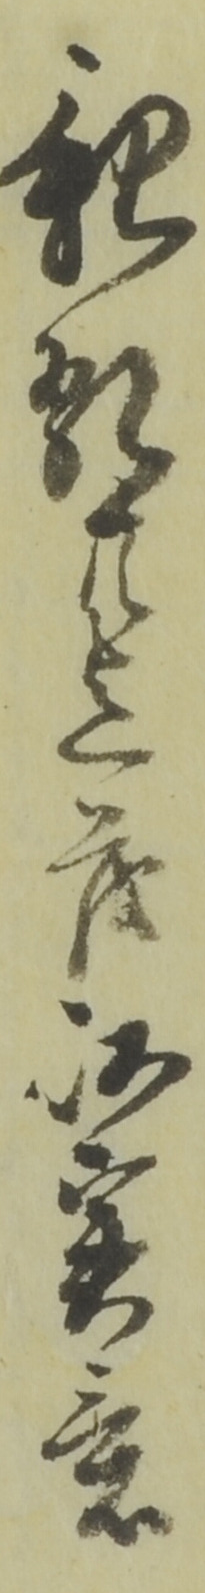親類共迄も以実意
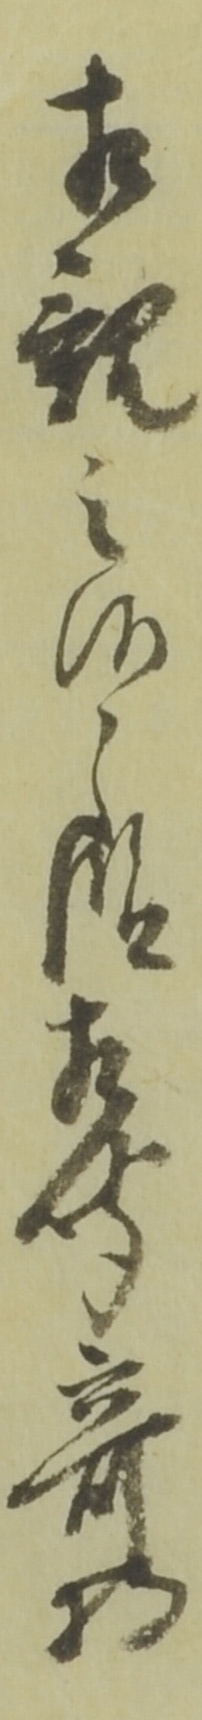相親之候之段相聞奇特
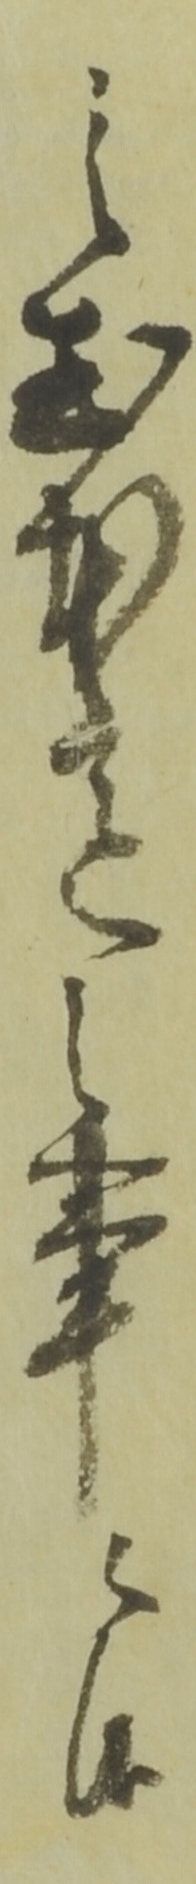之至本意之事ニ候
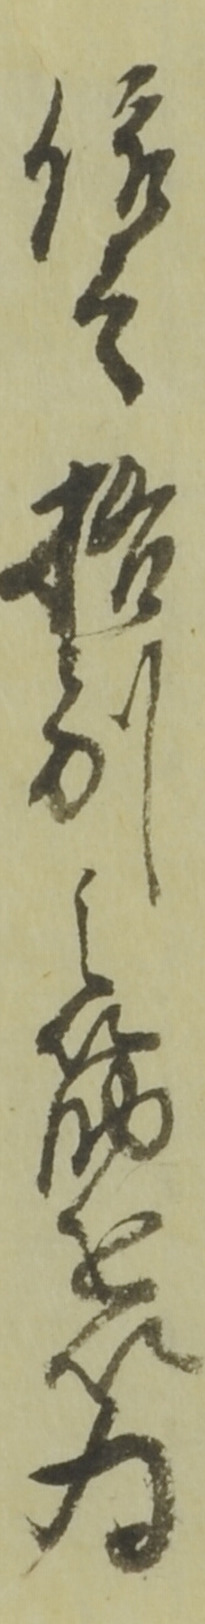依之格別之筋を以為
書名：御触書御書附控
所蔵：伊那市立高遠町図書館・合同会社AMANE
